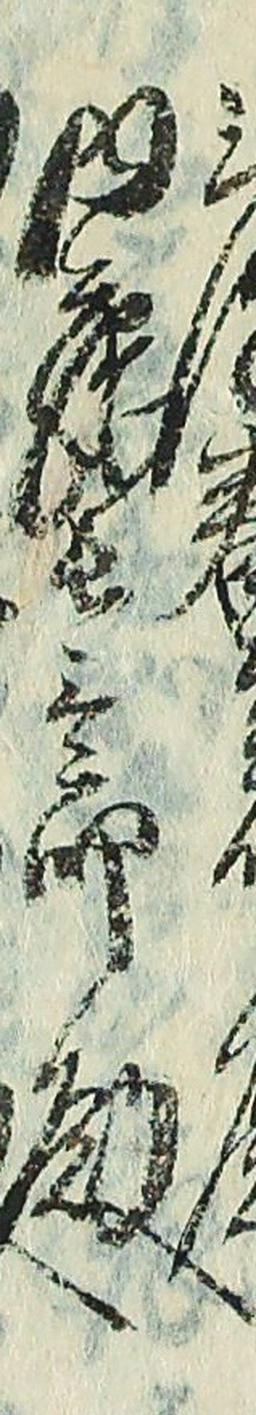内藤長三郎殿
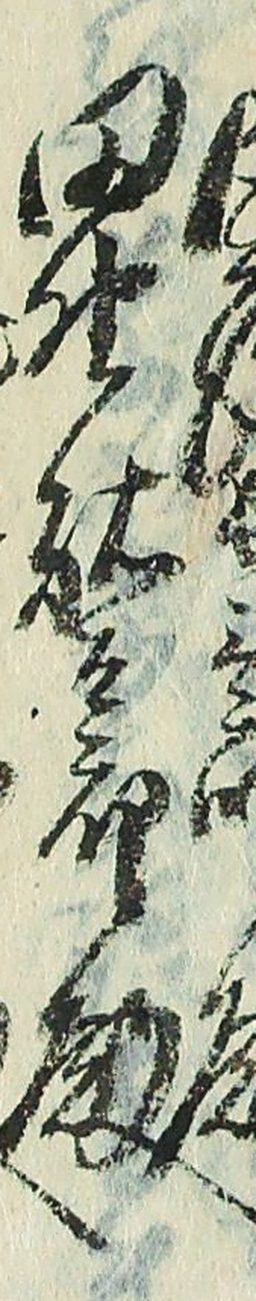田野祐太郎殿
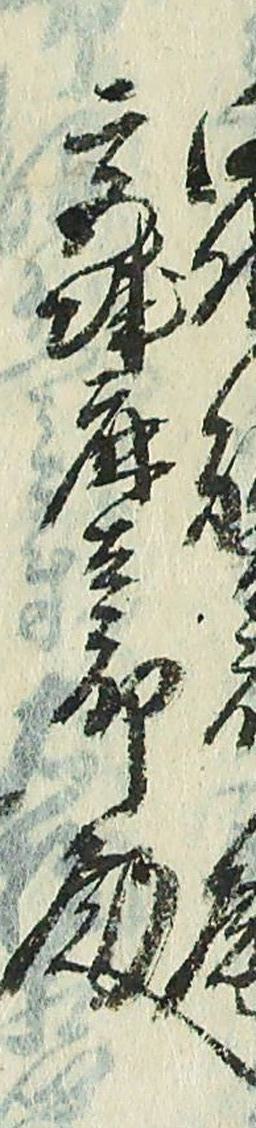宮城麻太郎殿
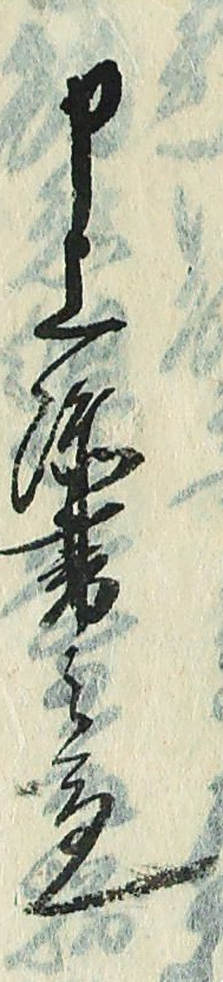申上添書之覚
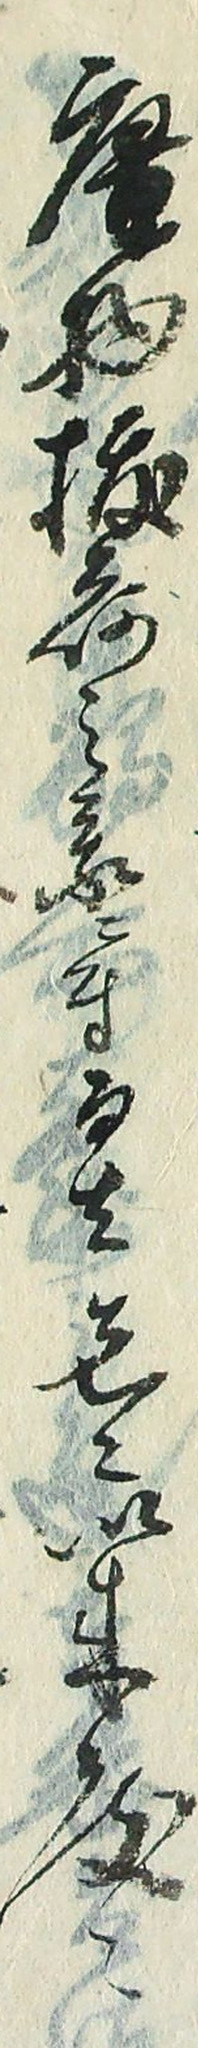唐物抜荷之義に付而は先々以来度々
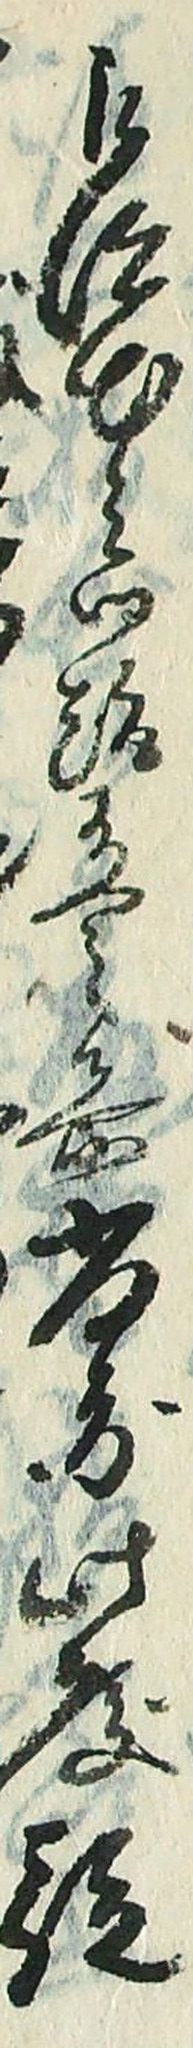被仰出之御趣有之候所尚亦此度従
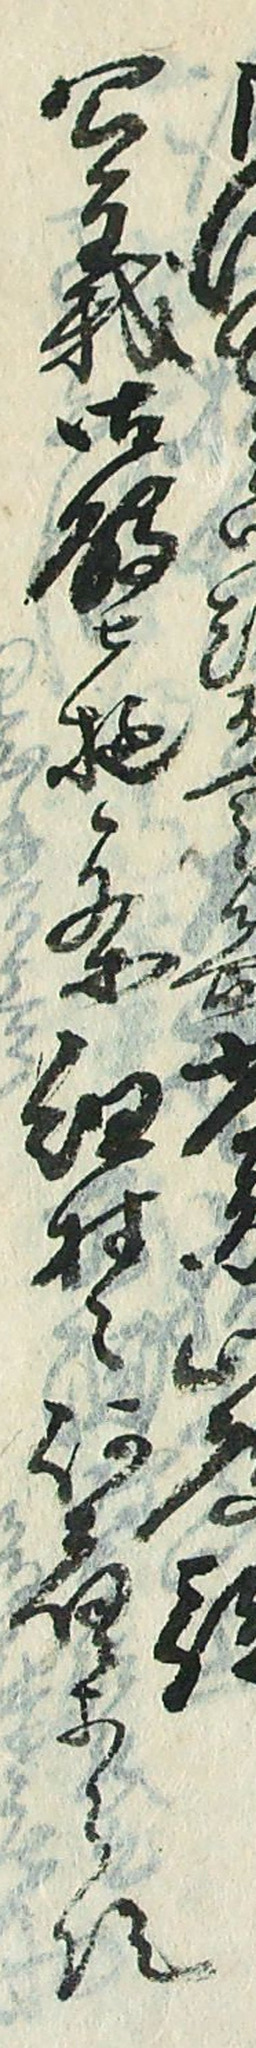公義御触被遊候条組村々何者によらす

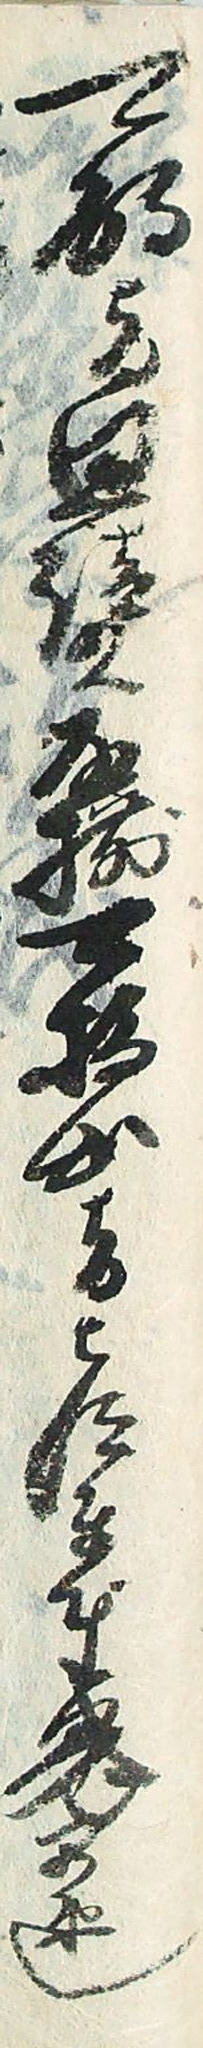可触旨且請書取揃可指出旨被仰付奉畏早速
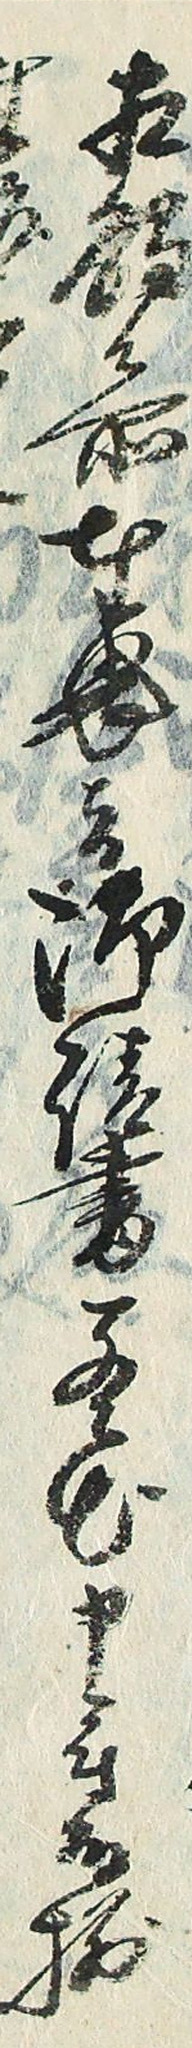相触候所奉畏旨御請書差出申に付取揃
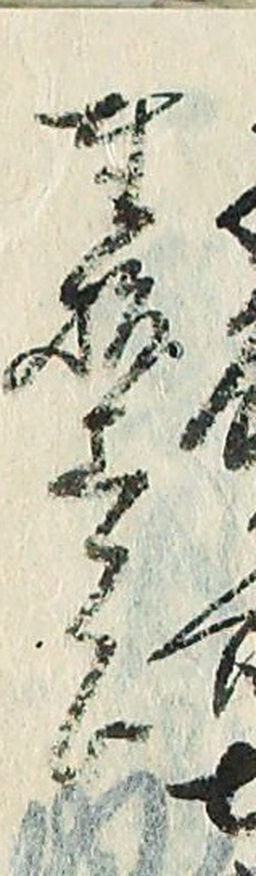奉指上候以上
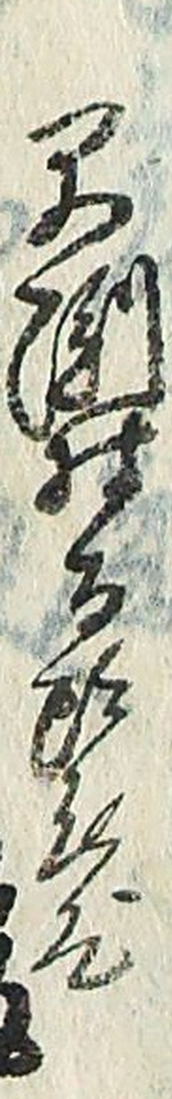早淵村与頭庄屋
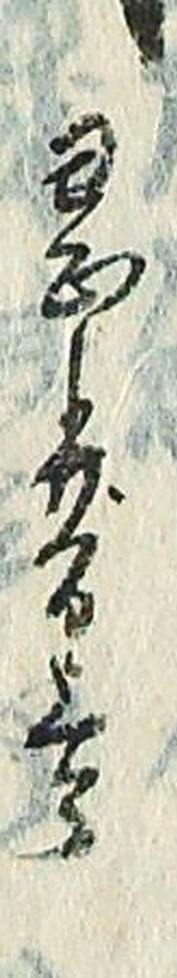丑正月廿一日上ケ
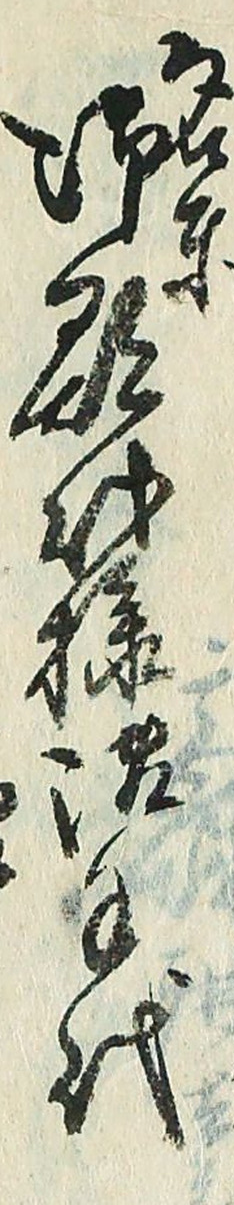御郡代様御手代
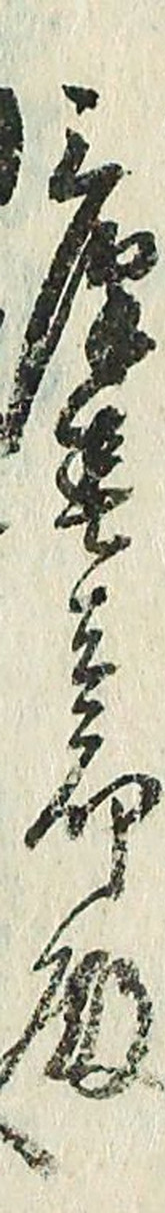三沢春太郎殿
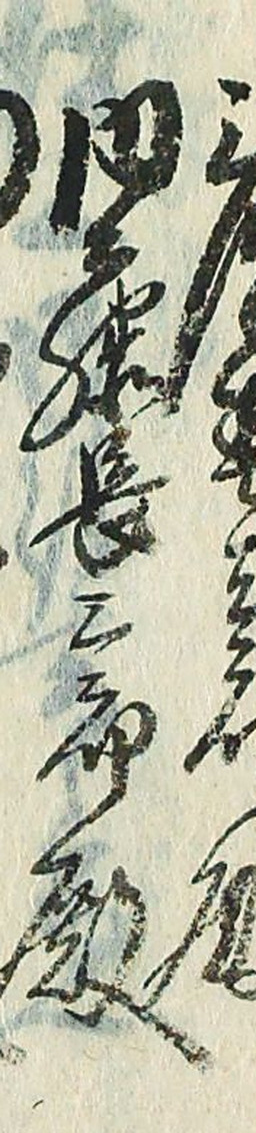内藤長三郎殿
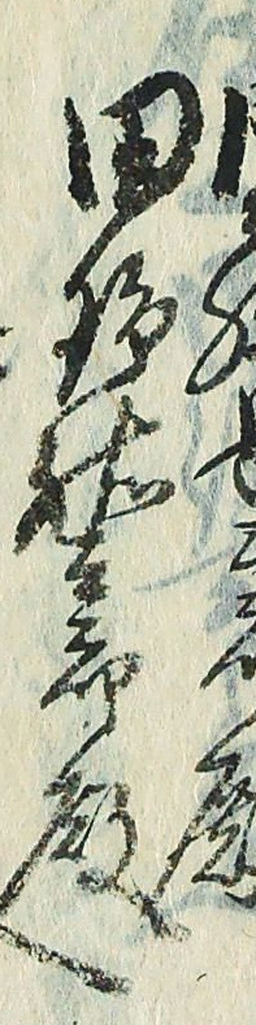田野祐太郎殿
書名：諸御用御□受書控
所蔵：鳴門教育大学 Naruto University of Education
